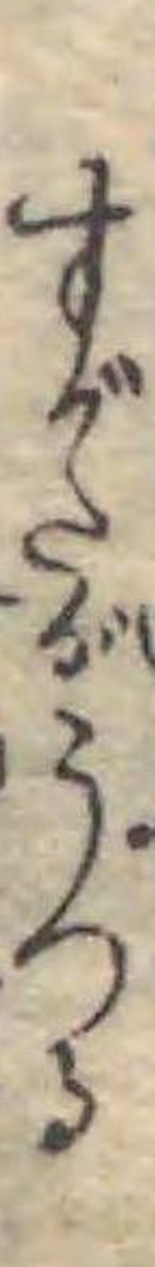すがたがうつる
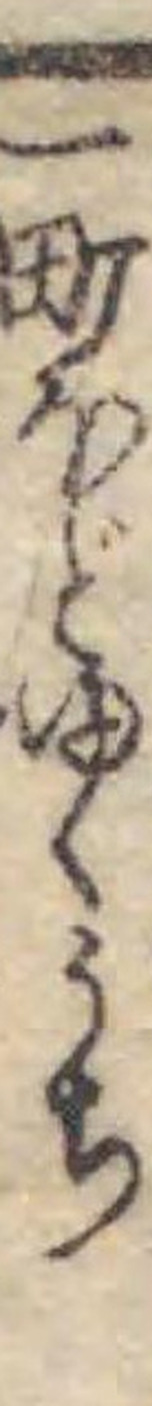一町ほどゆくうち
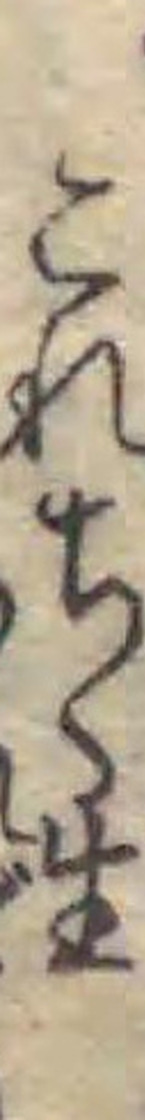これちく生
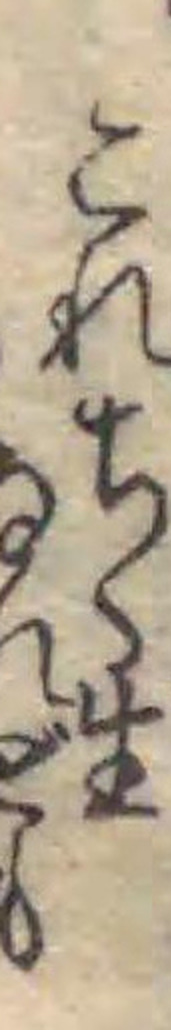これちく生
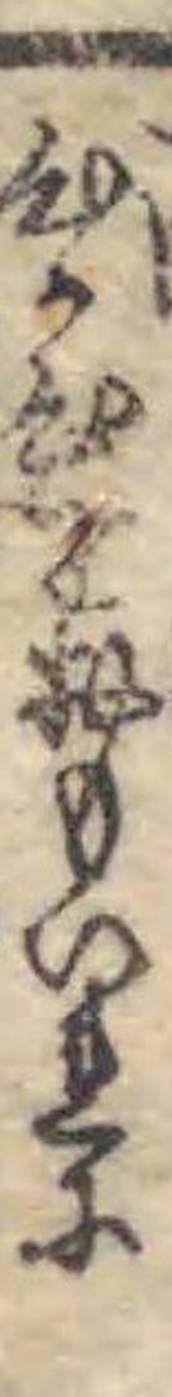心か心をおもいれに
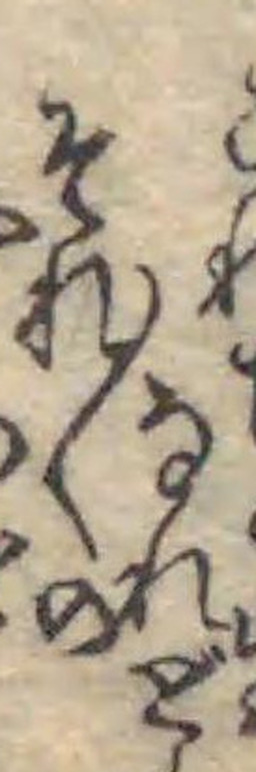それ〳〵の
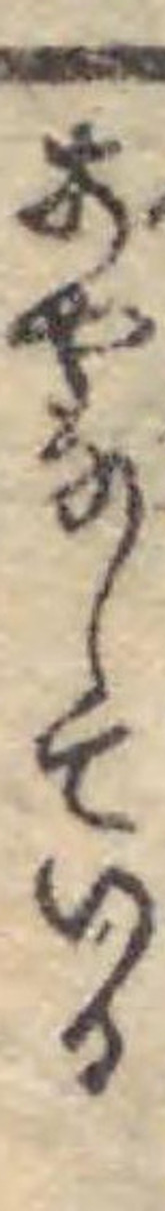あやなしている
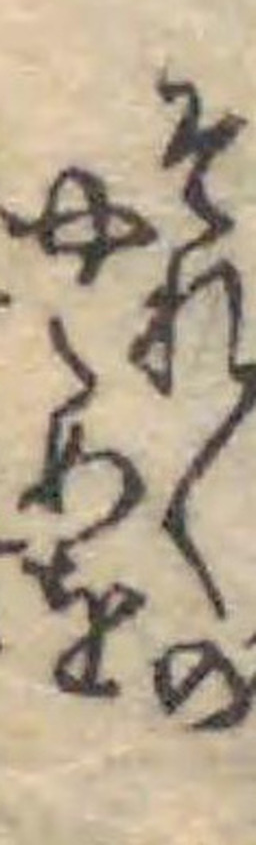やくめを
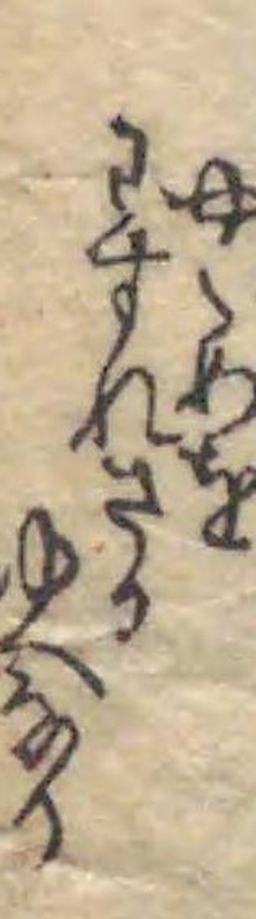わすれさる
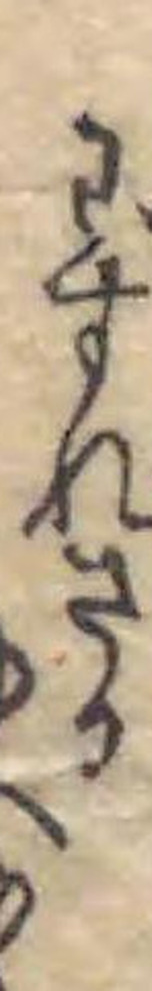わすれさる
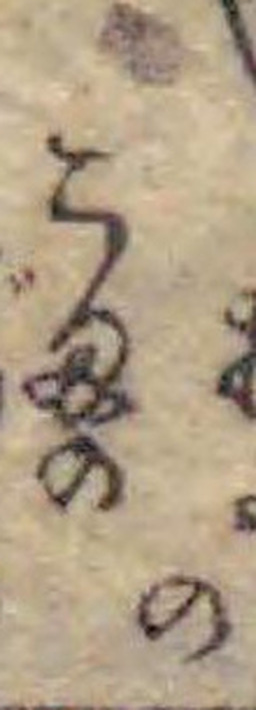こまの
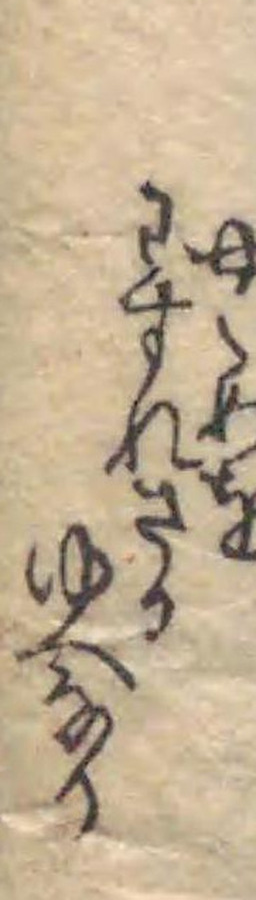わすれさる
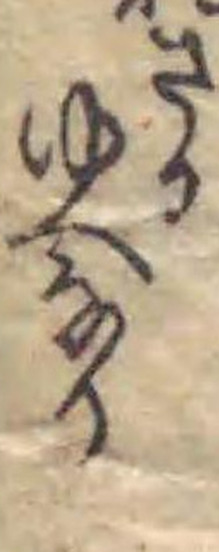ゆへなり
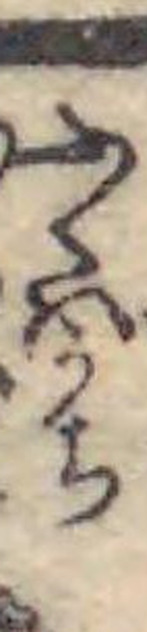ふくはうち
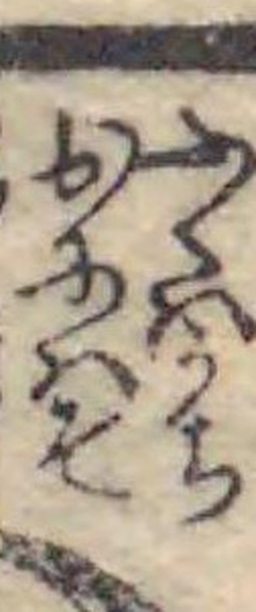おにはそ
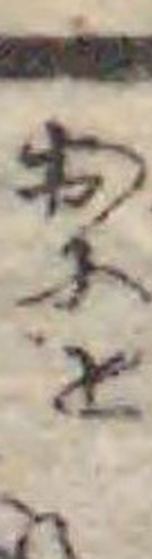おにを
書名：人心鏡写絵 : 3巻
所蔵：国立国会図書館 National Diet Library, JAPAN
